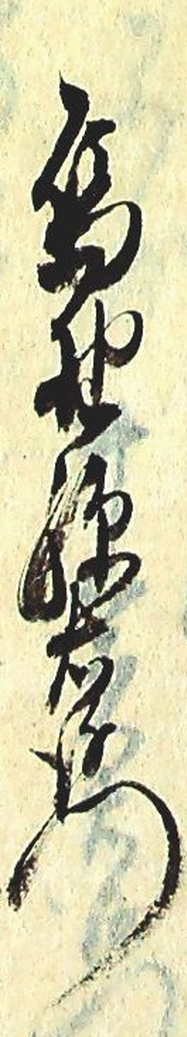鷹野孫右衛門
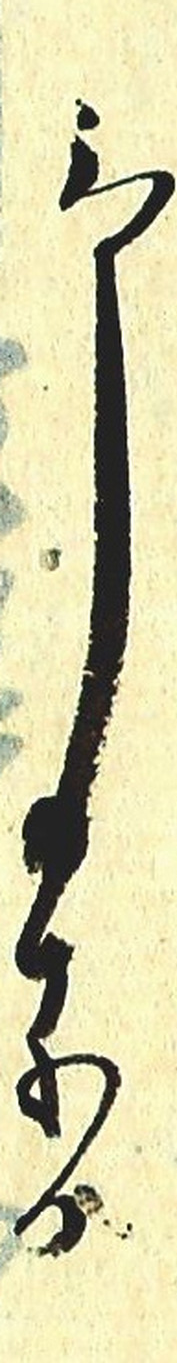三月十五日
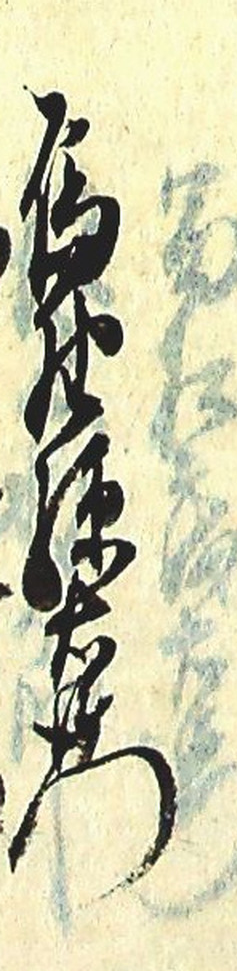鷹野孫右衛門

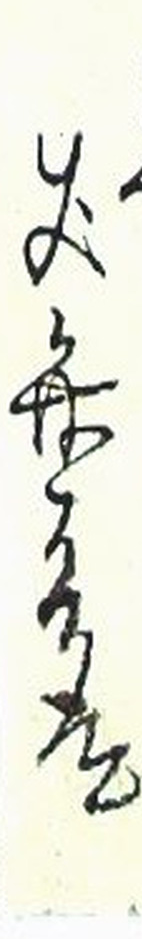丈弁吉殿

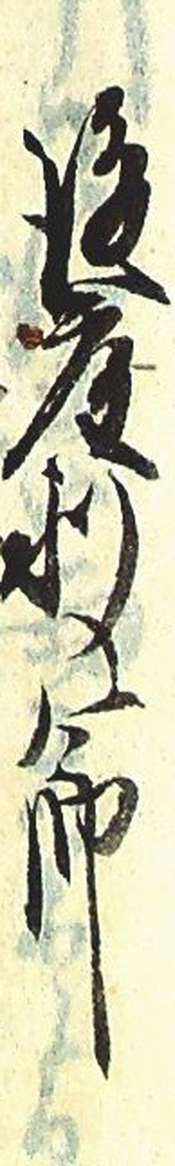後藤利八郎
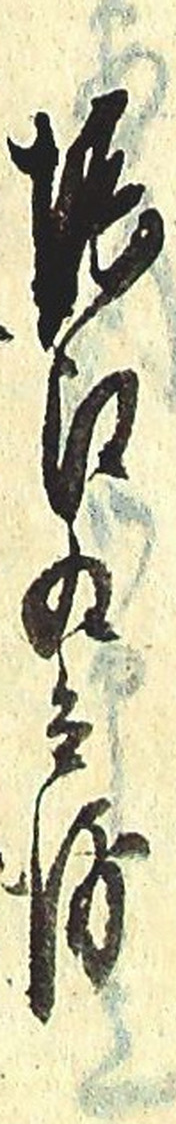堀江九兵衛
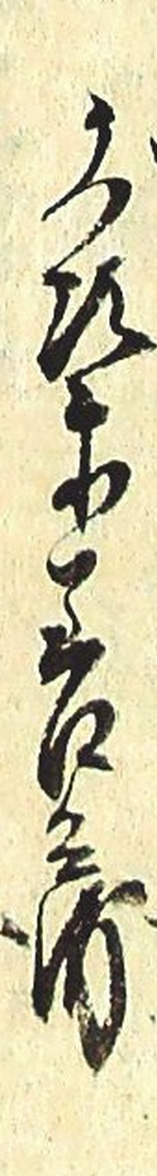久須米善兵衛
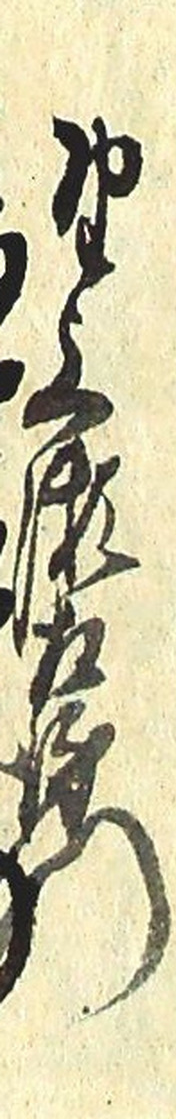野上瀬左衛門
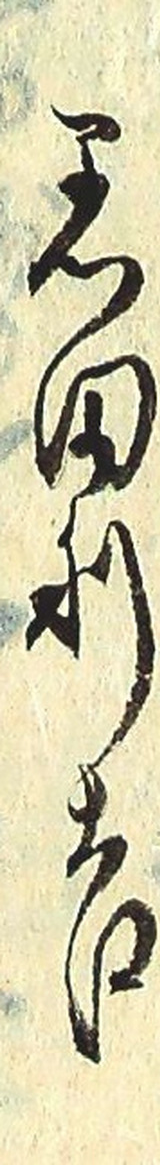黒田利吉
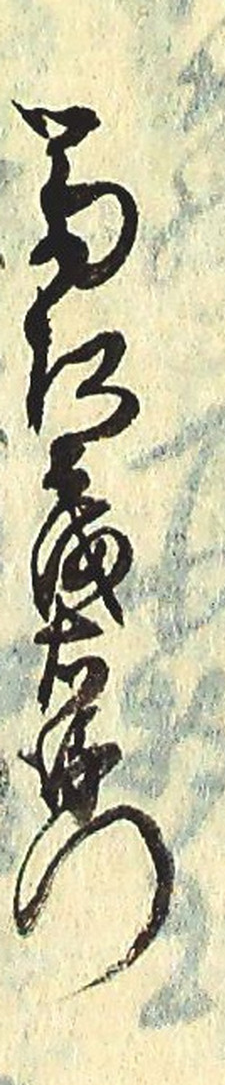冨松茂右衛門
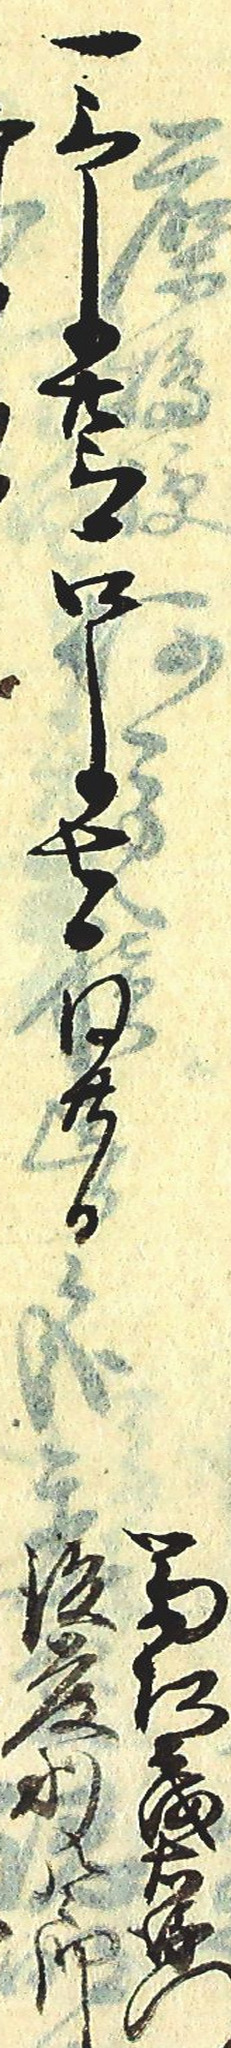一三月廿三日四月七日同廿日後藤利八郎
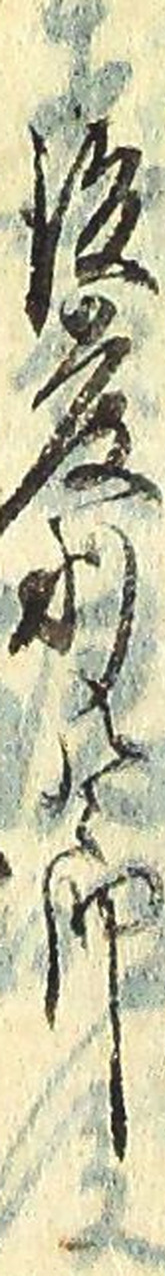後藤利八郎
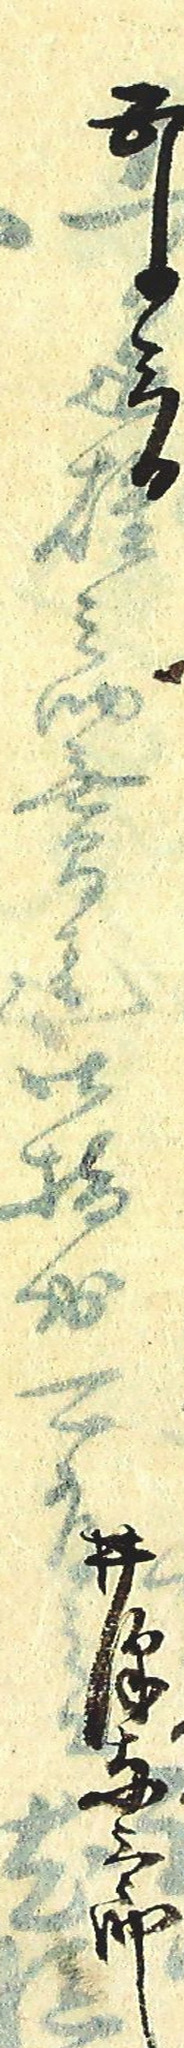五月三日井沢与三郎
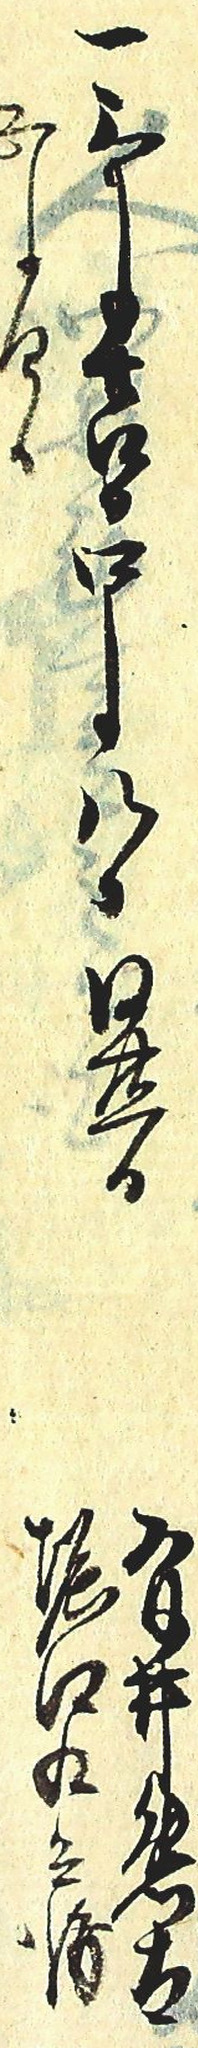一三月廿日四月四日同十七日堀江九兵衛
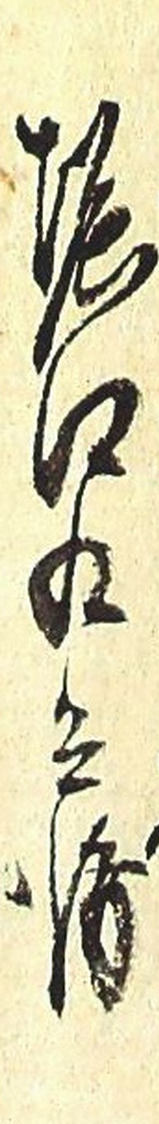堀江九兵衛
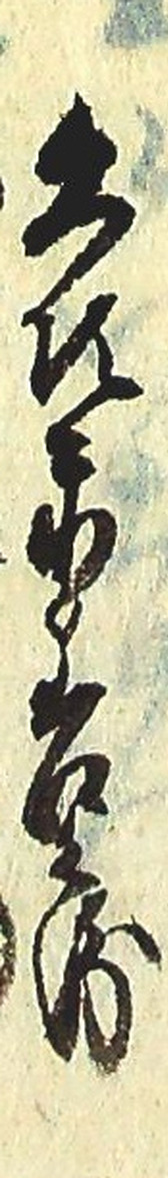久須米善兵衛
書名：諸御願書控(弐番）
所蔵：鳴門教育大学 Naruto University of Education
